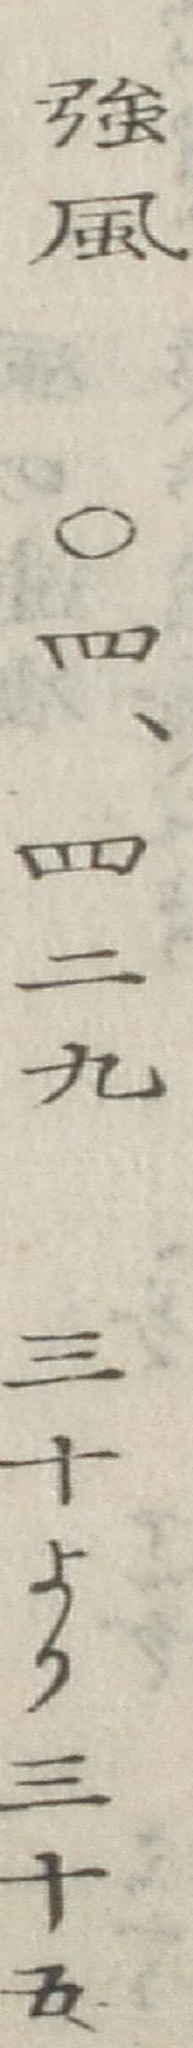強風〇四、四二九三十より三十五
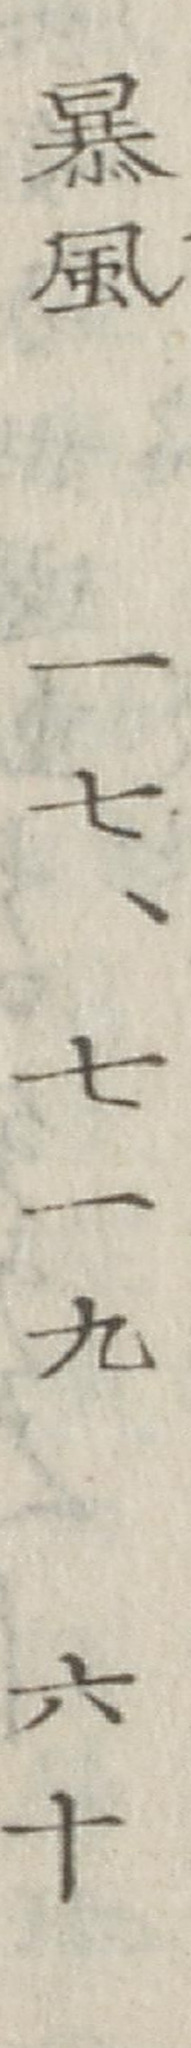暴風一七、七一九六十
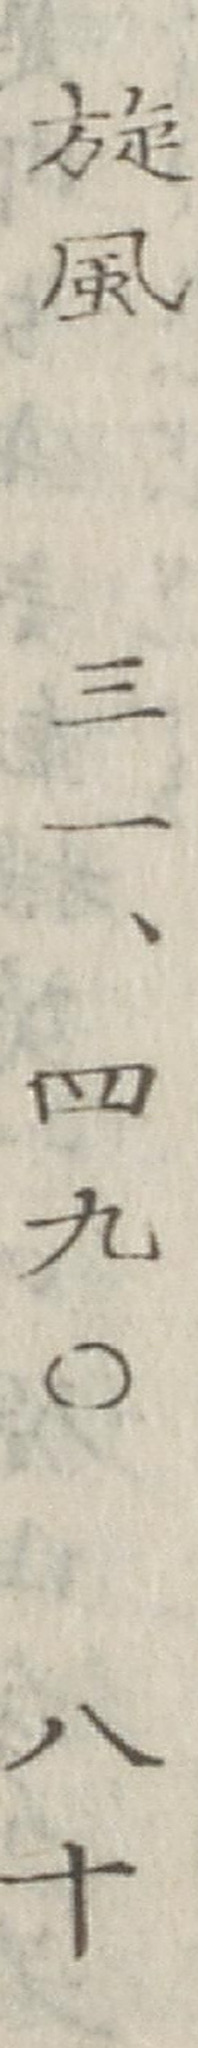旋風三一、四九〇八十
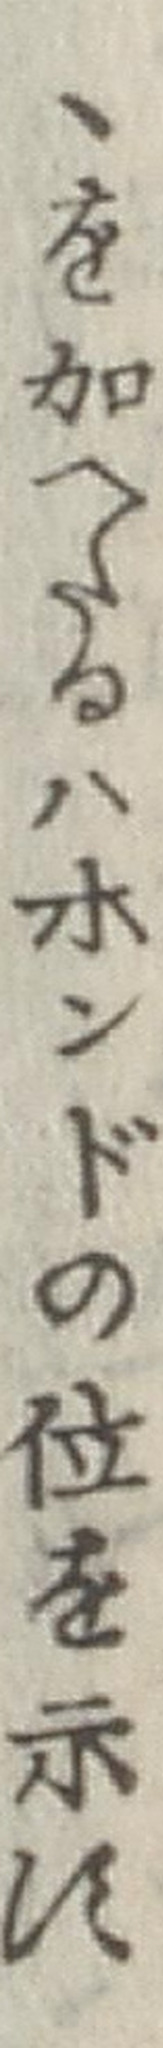、を加へたるはホンドの位を示す
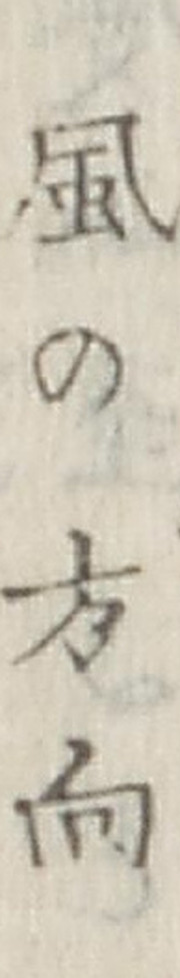風の方向
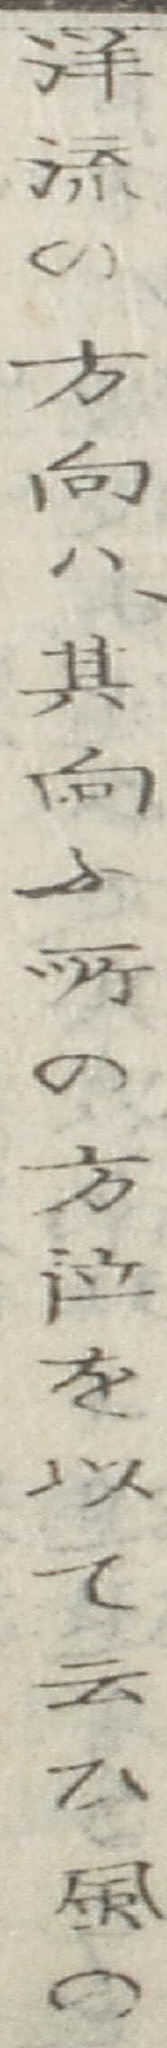洋流の方向は、其向ふ所の方位を以て云ひ、風の
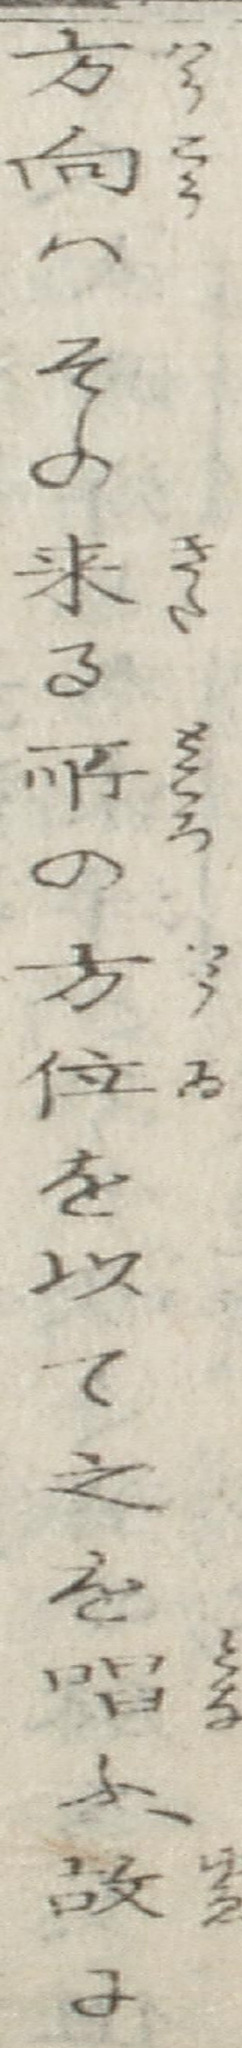方向はその来る所の方位を以て之を唱ふ、故に
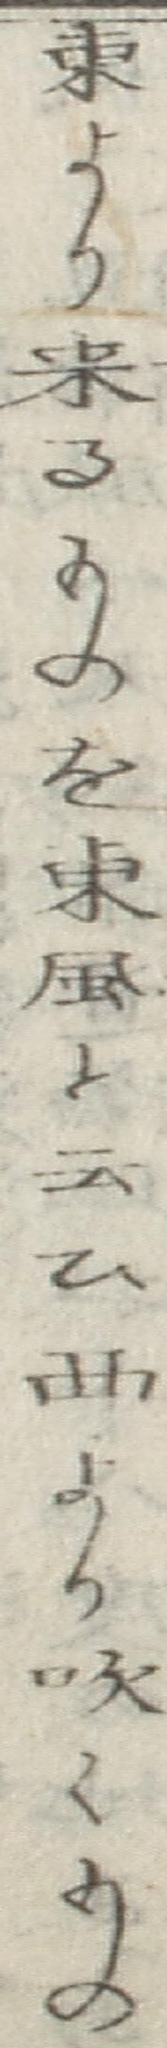東より来るものを東風を云ひ、西より吹くもの
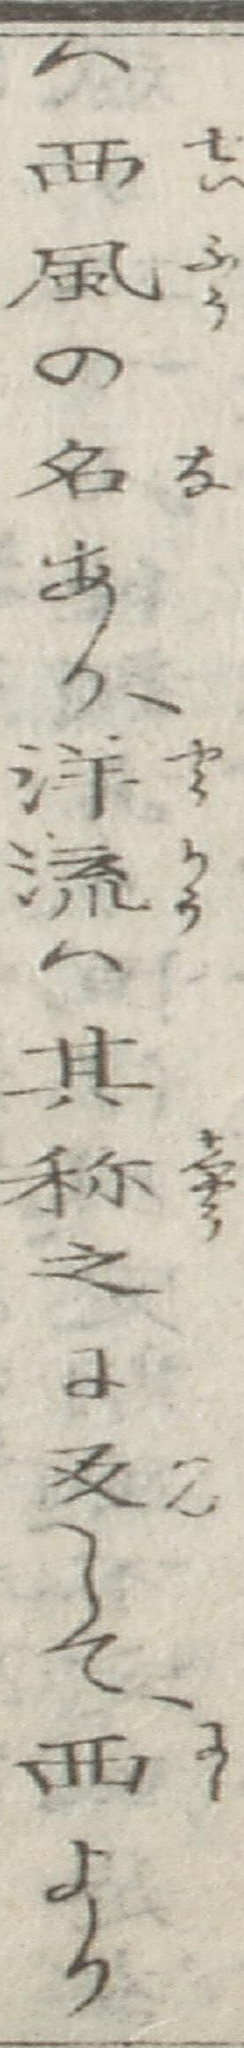は西風の名あり、洋流は其称之に反して、西より
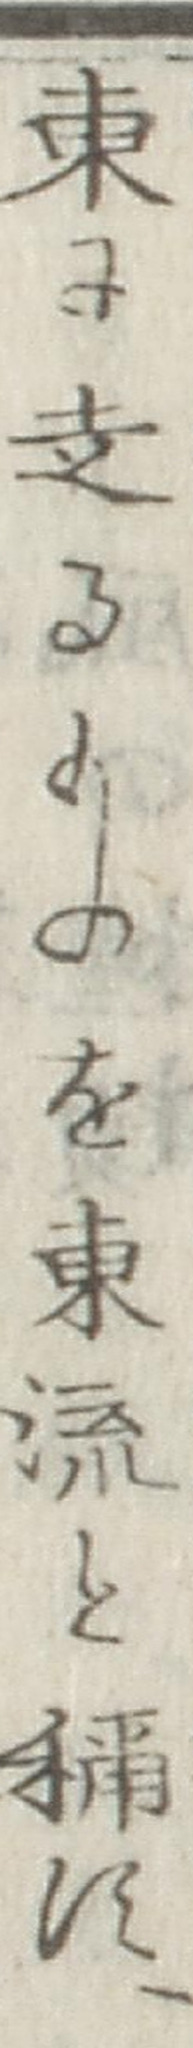東に走るものを東流と称す、
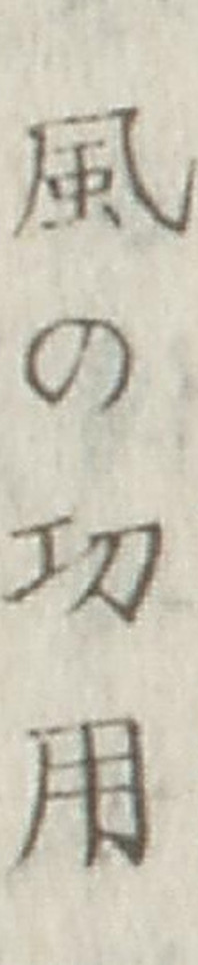風の功用
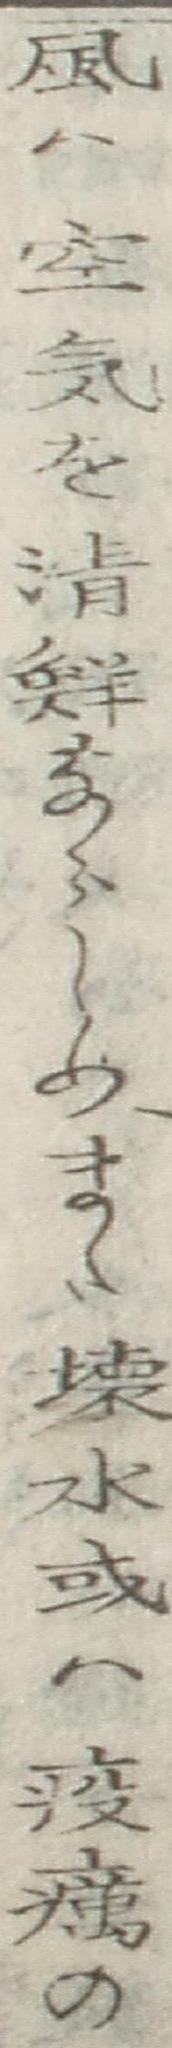風は空気を清鮮ならしめ、また壊水或は疫癘の
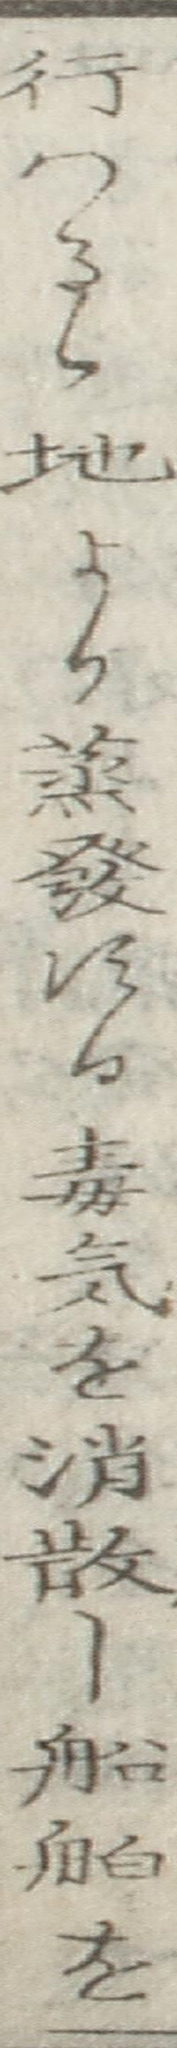行はるゝ地より蒸発する毒気を消散し船舶を

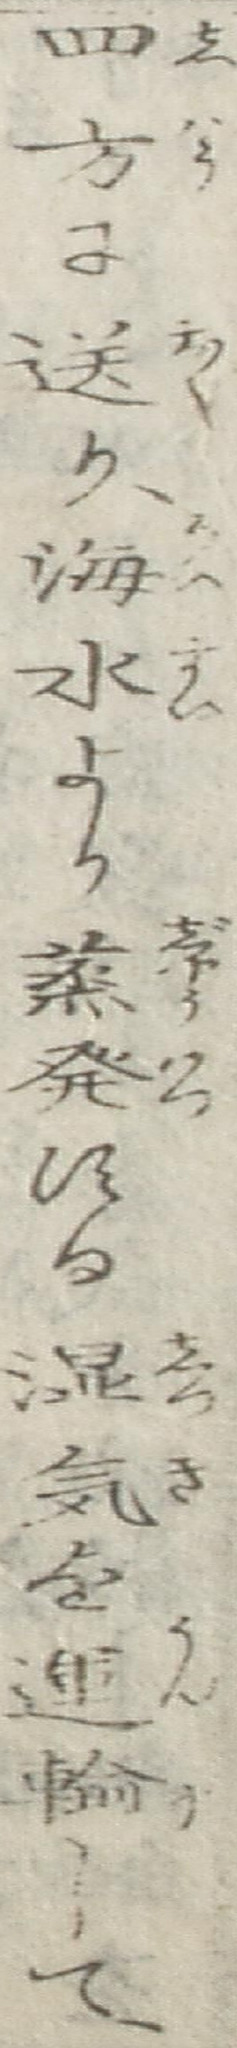四方に送り、海水より蒸発する湿気を運輸して、
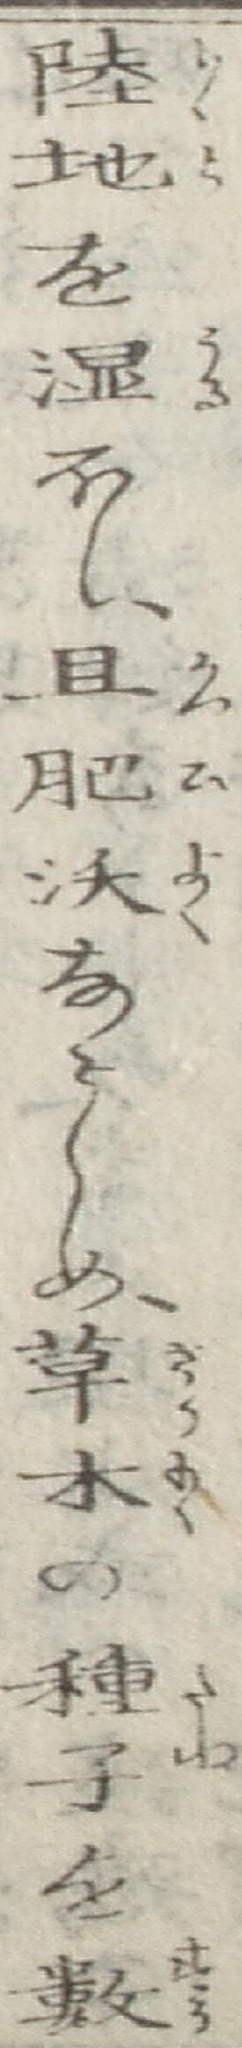陸地を湿ほし、且肥沃ならしめ、草木の種子を数
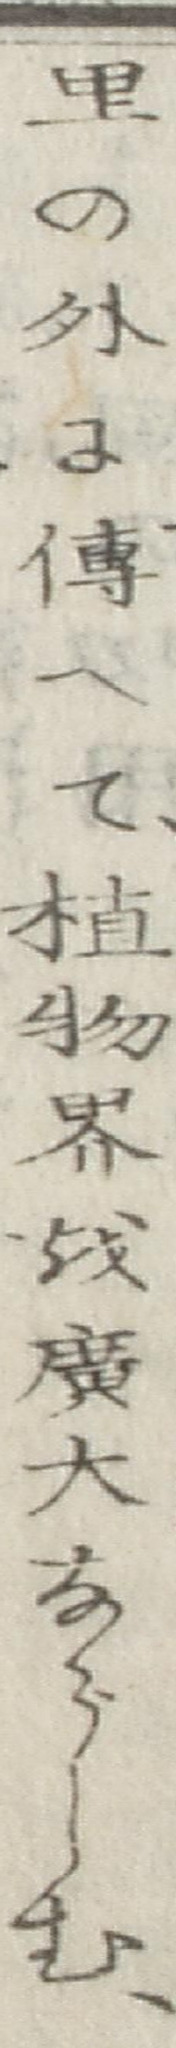里の外に伝へて、植物界を広大ならしむ、
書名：訓蒙　天然地理學　中
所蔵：東京大学地震研究所図書室 Earthquake Research Institute Library, The University of Tokyo, JAPAN
